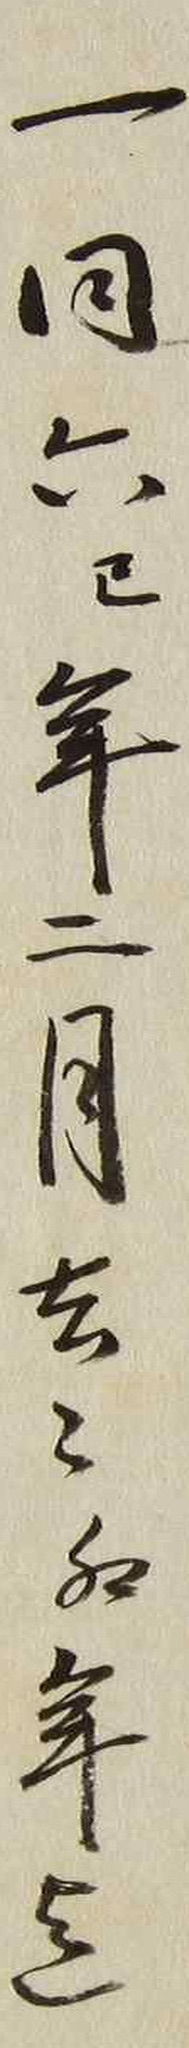一同六巳年二月去々卯年迄
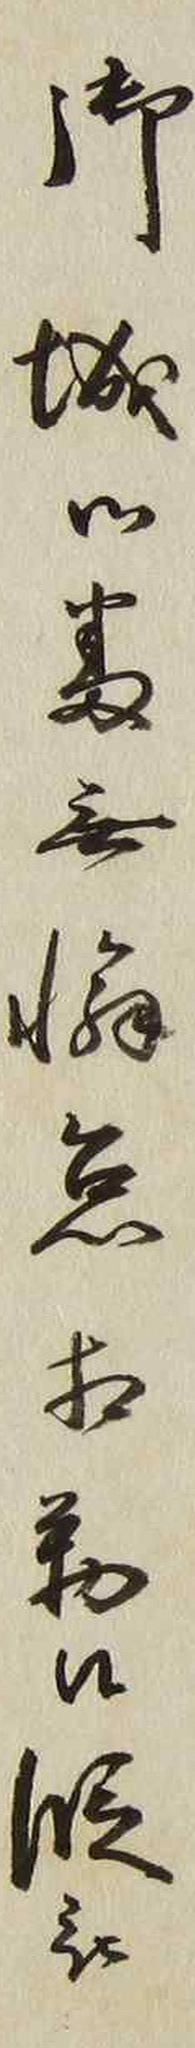御城御番無懈怠相勤候段被
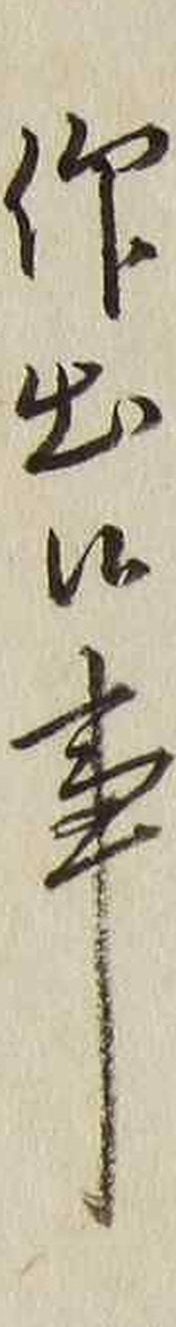仰出候事
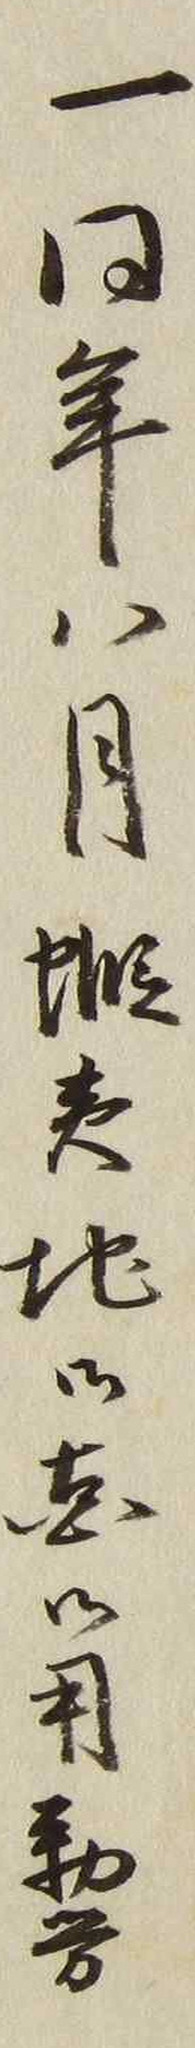一同年八月蝦夷地御固御用勤労

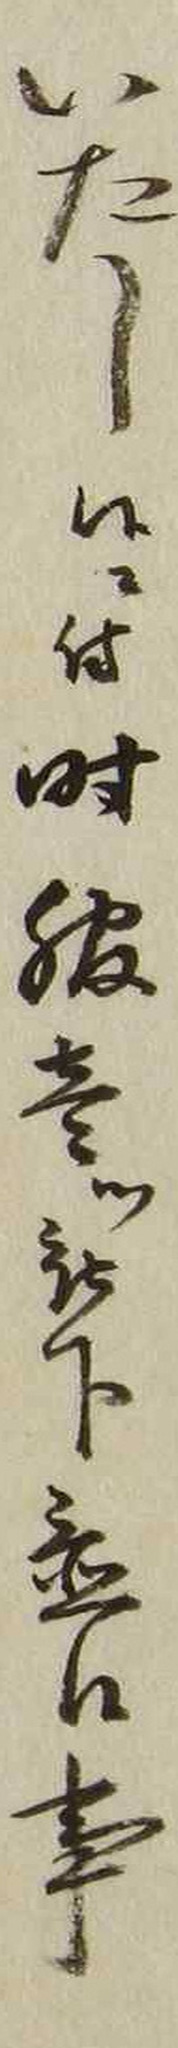いたし候ニ付時服壱ツ被下置候事
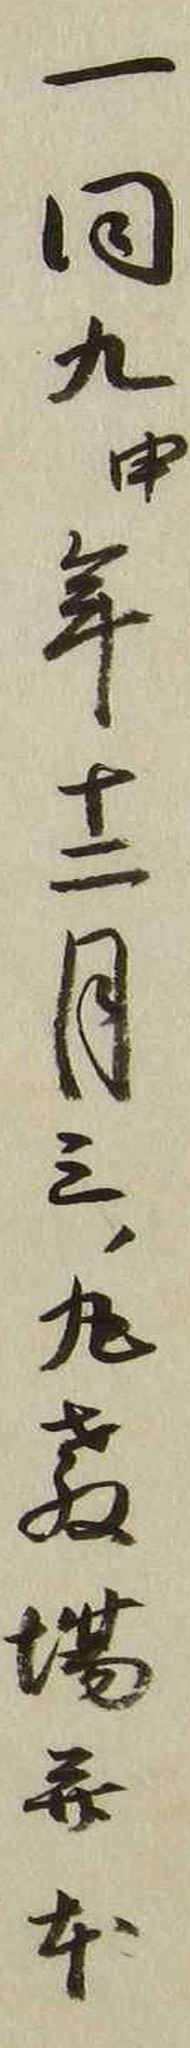一同九申年十二月三ノ丸教場并本
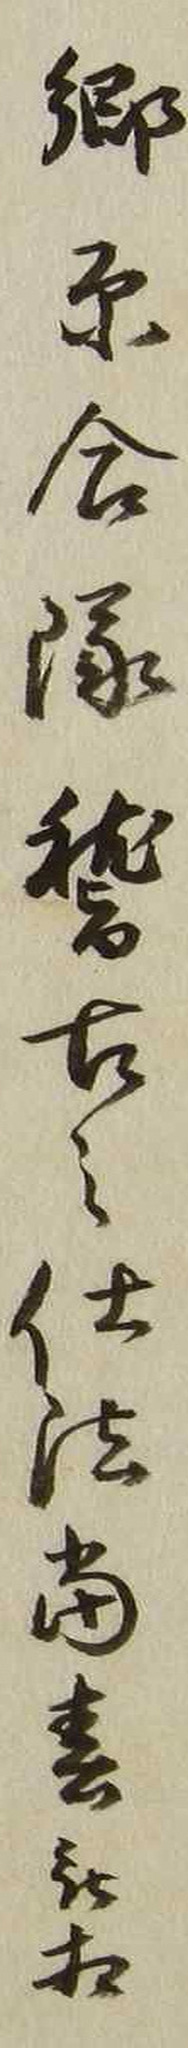郷原合隊稽古之仕法当春被相
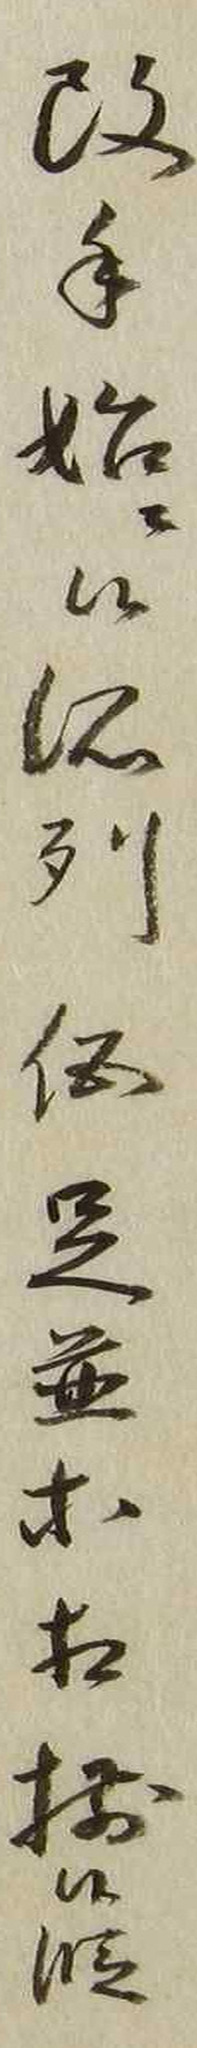改手始ニ候所列伍足並等相揃候段
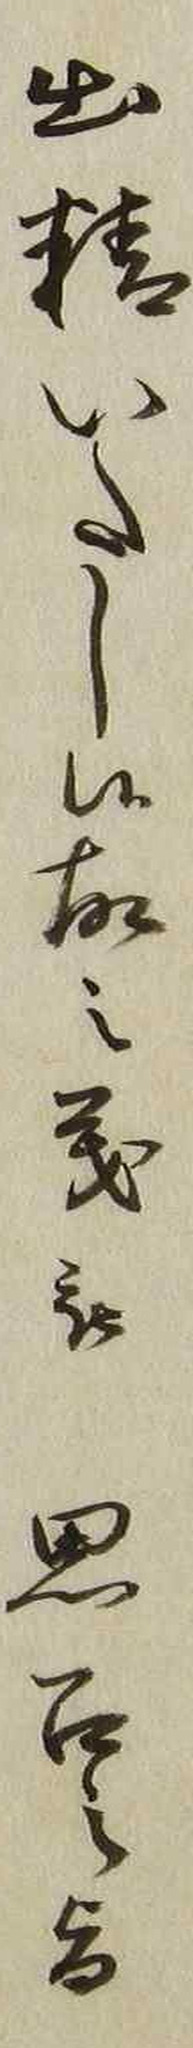出精いたし候故之義被思召之旨
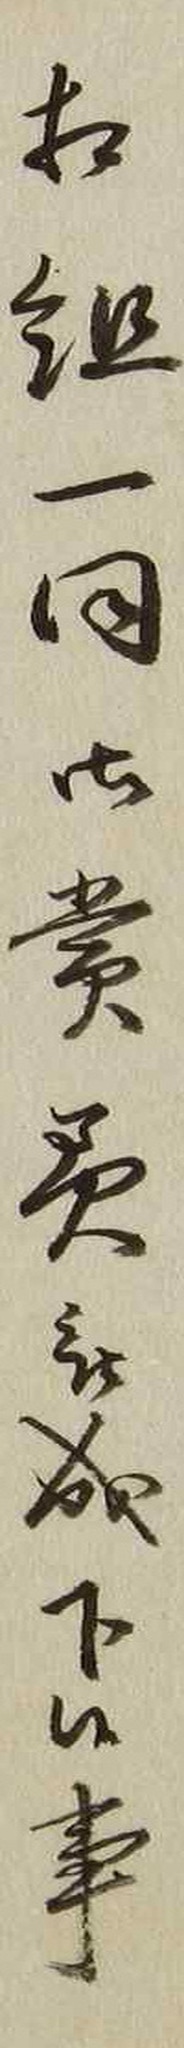相組一同御賞美被成下候事
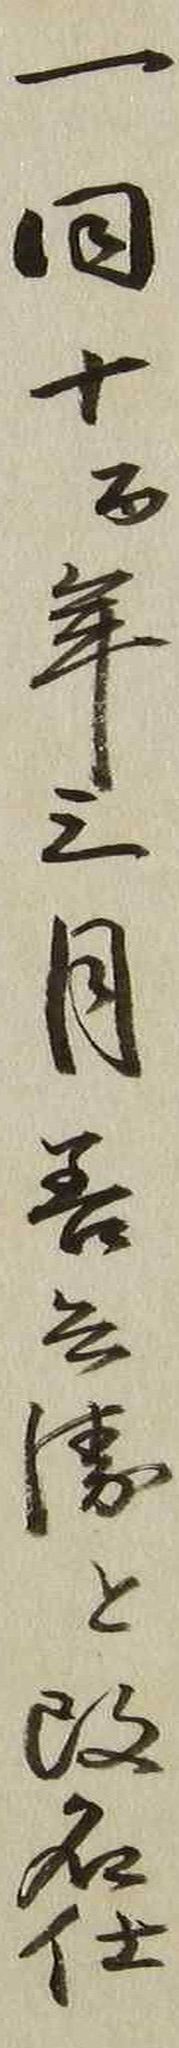一同十酉年三月善兵衛と改名仕
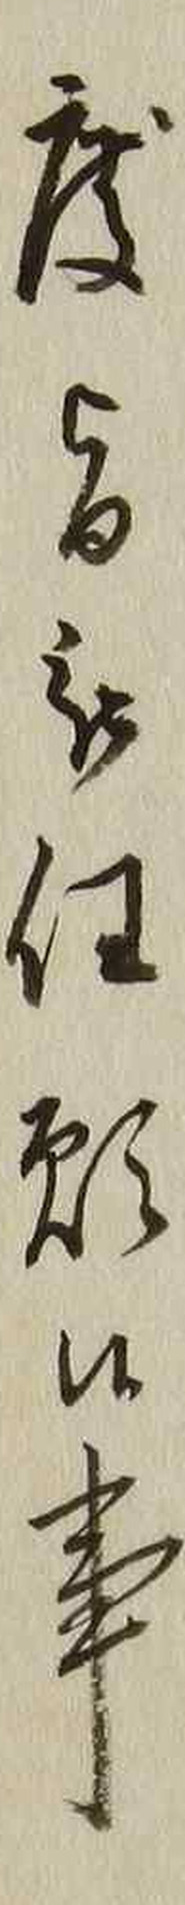度旨被任願候事
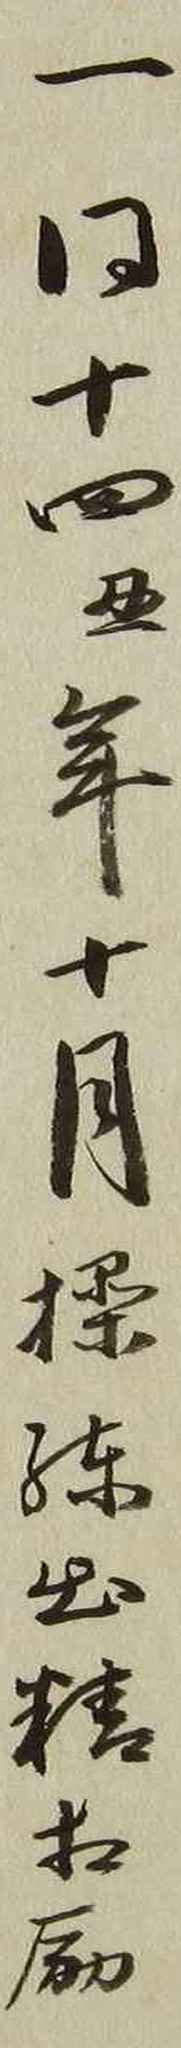一同十四丑年十月操練出精相励
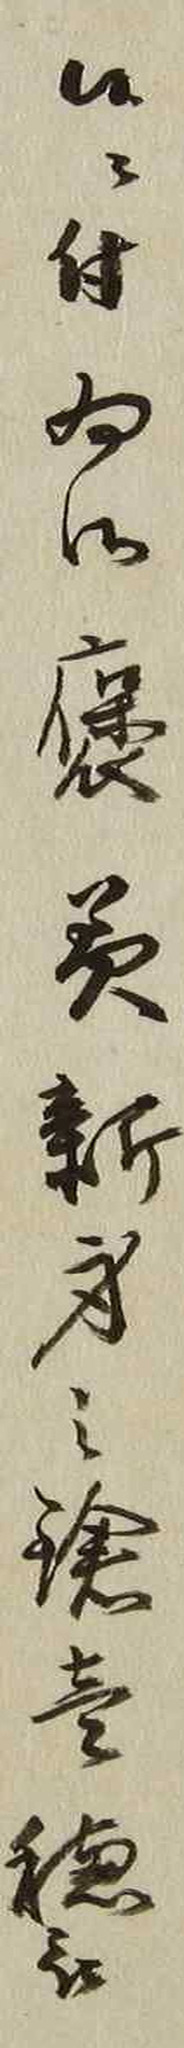候ニ付為御褒美新身之鎗壱穂被
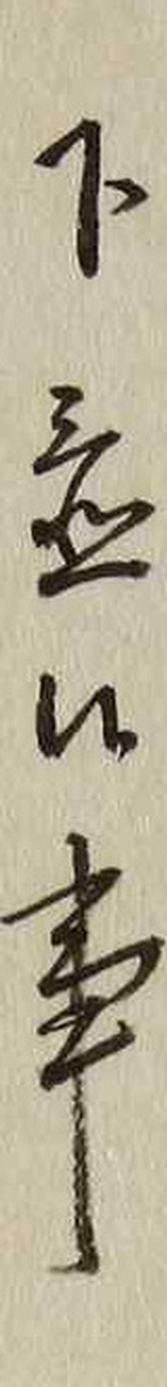下置候事
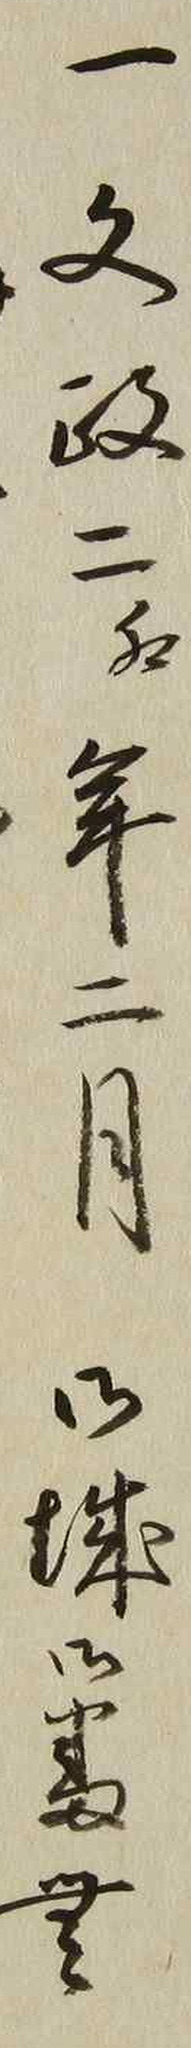一文政二卯年二月御城御番無
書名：諸士系譜　巻之149　そ之部2
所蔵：会津若松市立会津図書館
